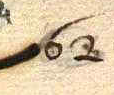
62
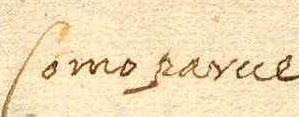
Como parece
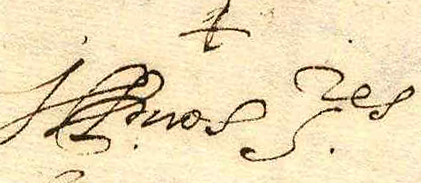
Jll.mos S.res
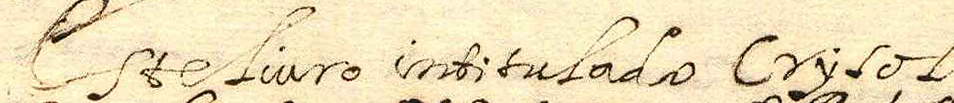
Este Liuro intitulado Crysol
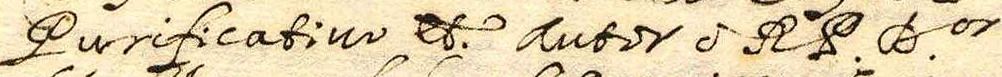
Purificatiuo &t. autor o R P. D.or
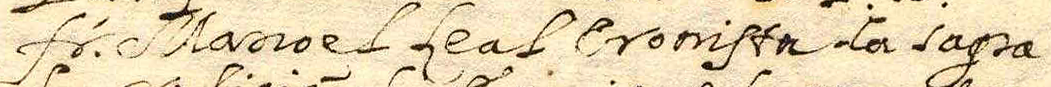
fr. Manoel Leal Cronista da sagra
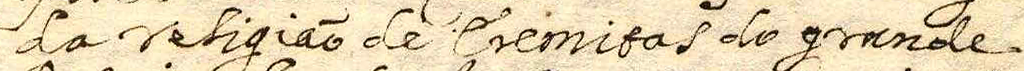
da religiaõ de Eremitas do grande
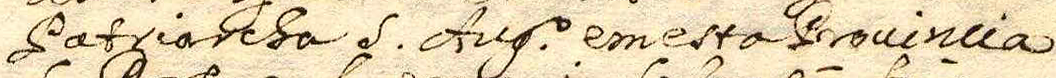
Patriarcha S. Aug.o em esta Prouincia
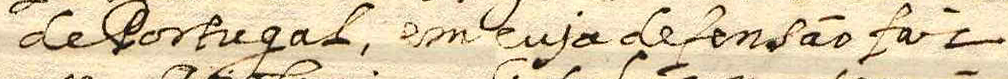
de Portugal, em cuja defensão faz
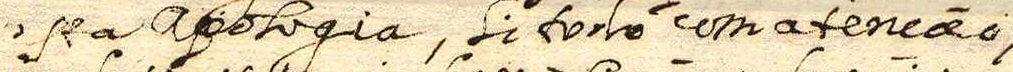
esta apologia, Li todo com atençaõ;
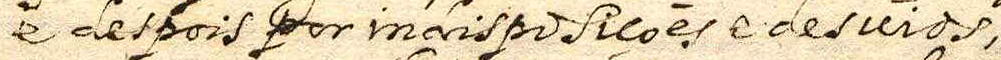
e despois por indisposiçoẽs E desuios,
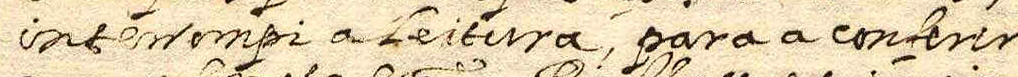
intorrompi a Leitura, para a conferir
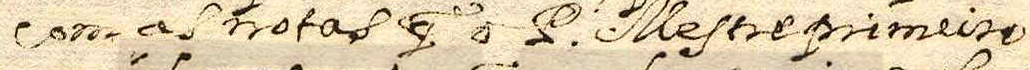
com as notas q̄ o P. Mestre primeiro
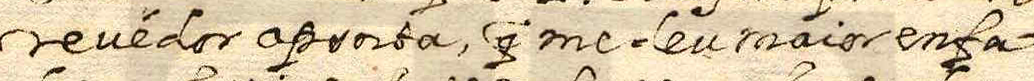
reuedor aponta, q̄ me deu maior enfa
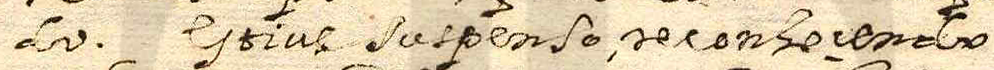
do. Estiue suspenso, reconhecendo
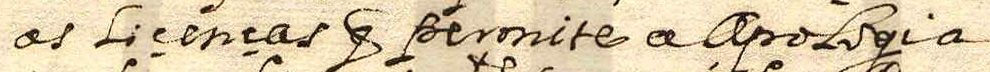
as Licenças q̄ permite a Apologia
